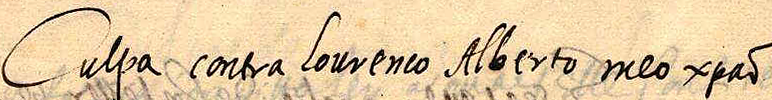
Culpa contra Lourenco Alberto meo xpaõ
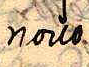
nouo
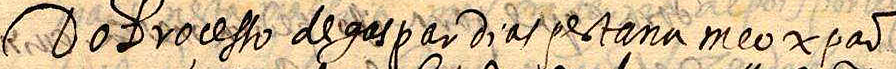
Do Proçesso de gaspar dias pestana meo xpaõ
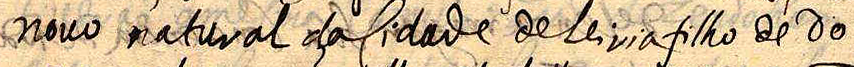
nouo natural da Cidade de Leiria filho de do
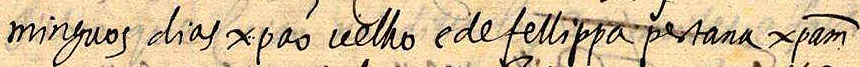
minguos dias xpaõ uelho e de fellipa pestana xp̄am
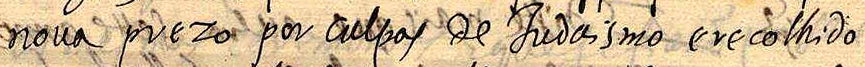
noua prezo por culpas de Judaismo e recolhido
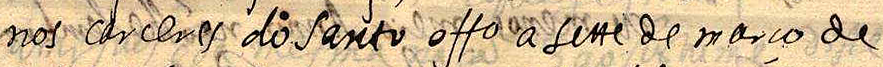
nos carceres do santo offo a sette de março de
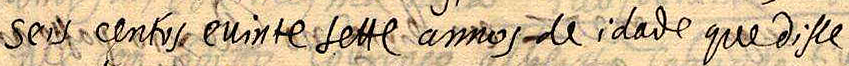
seiscentos e uinte sette annos de idade que disse
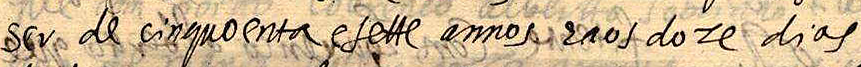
ser de cinquoenta e sette annos E aos doze dias
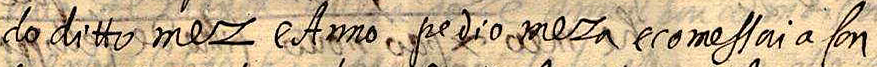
do ditto mez e Anno pedio meza e comessou a Con
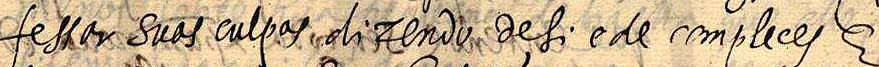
fessar suas culpas dizendo de si e de compleçes E
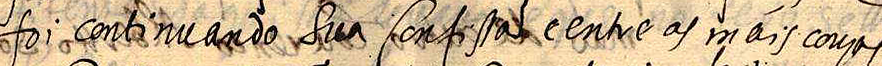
foi continuando sua Confissaõ e entre as mais couzas
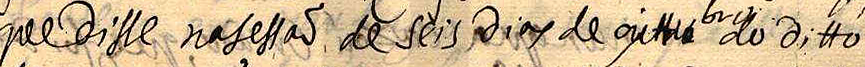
que disse na sessaõ de seis dias de outtubro do ditto
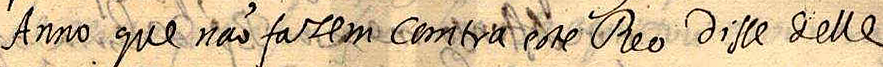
Anno que naõ fazem comtra este Reo disse delle
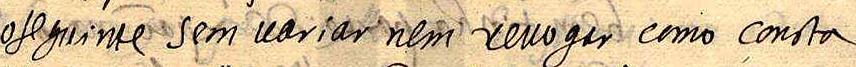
o seguinte sem uariar nem reuogar como consta
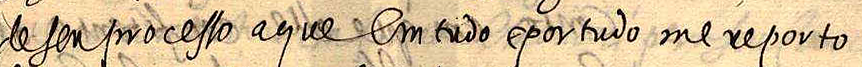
de seu processo a que em tudo e por tudo me reporto
